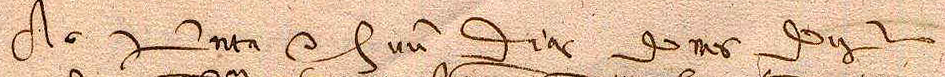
Aos tinta e huū dias do mes doutro
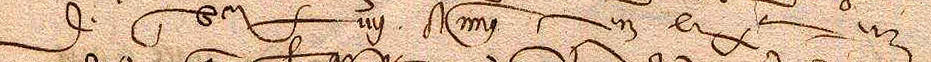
de j̄ bc Riiij . Annꝯ em lixa em
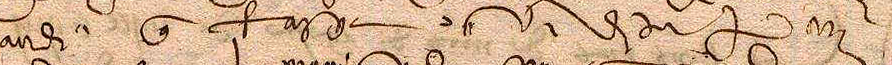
audia q̄ fazya o sor̄ dtor Joam
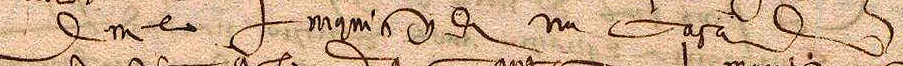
de melo Jmquisydor na Casa do
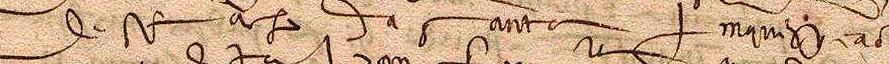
despacho da santa Jmquisycão
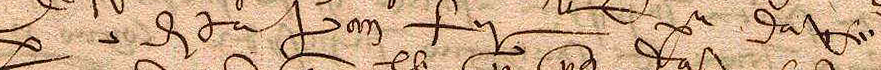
ꝑ o dtor Joam ferra por da Ree
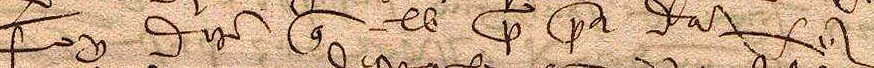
foy dito q̄ elle p̄o p̄t da Ree
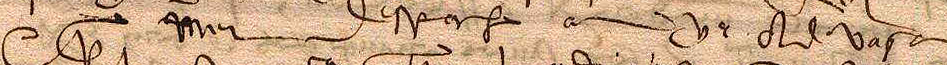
e p̄o ner despacho avya A devasa
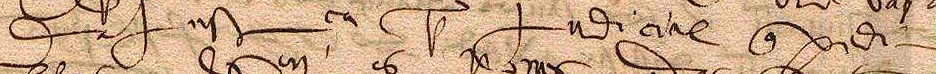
da Justça p̄o Judiçial q̄ pedia
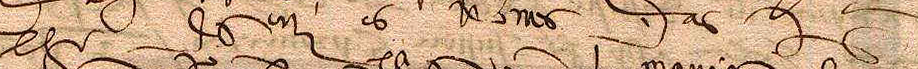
lhe desem os nomes das tsa
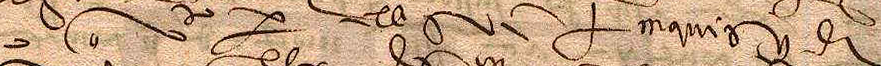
o q̄ vto ꝑ elle sor̄ Jmquisydor
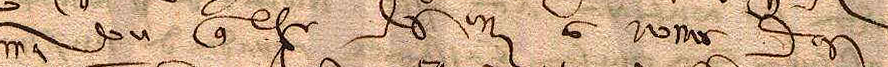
m̄adou q̄ lhe desem os nomes das
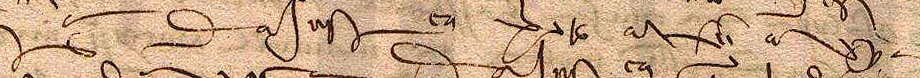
tsa da Justca pojs a Ree avya
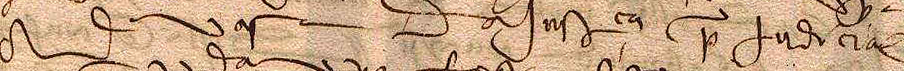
A devasa da Justça p̄o Judicial
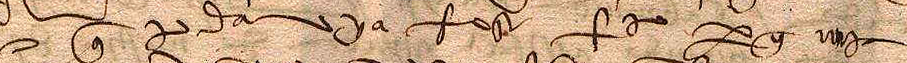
e q̄ todavya fose fto ꝑgunta
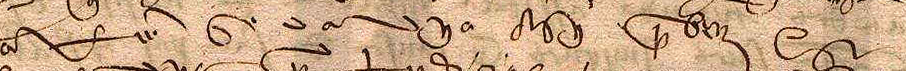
a Ree se o avya Asy p̄ bem e se
